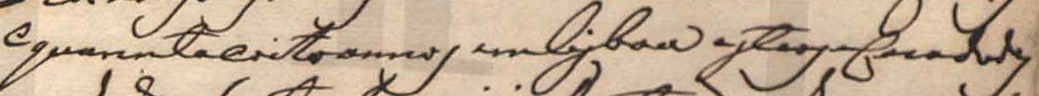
e quarenta e oito annos em lisboa estaos Caza do des
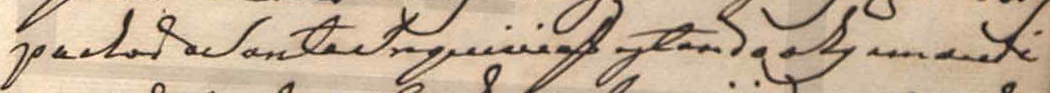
pacho da Santa Inquiziçaõ estando ahy em audi
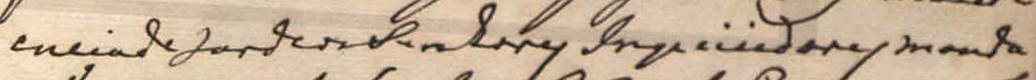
encia de tarde os Senhores Inquizidores manda
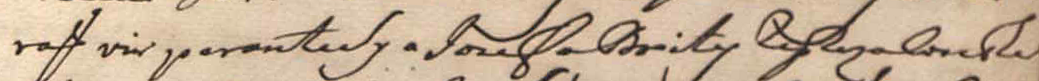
raõ vir perante sy a Iozefa Brites Re pReza Conthe
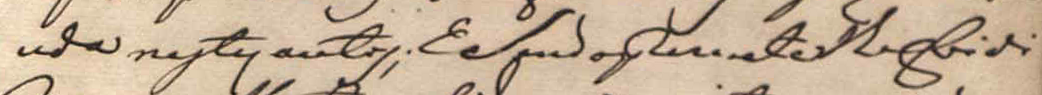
uda nestes autos; E Sendo prezente lhe foi di
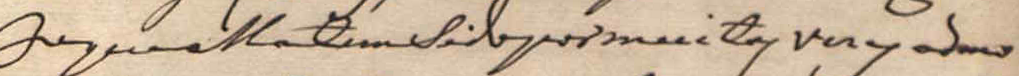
to que ella tem sido por muitas vezes admo
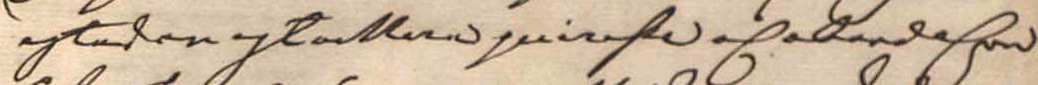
estada nesta Meza quizesse aCabar de Con
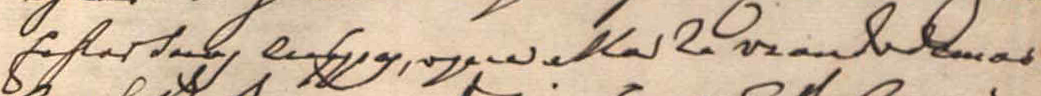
fessar suas culpas, o que ella Re vzando de maó
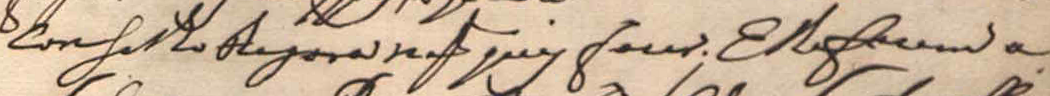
Conselho the gora naõ quis fazer. E lhe fazem a
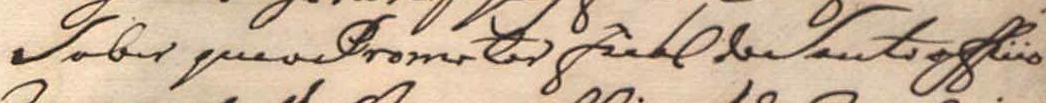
Saber que o Promotor fiscal do Santo officio
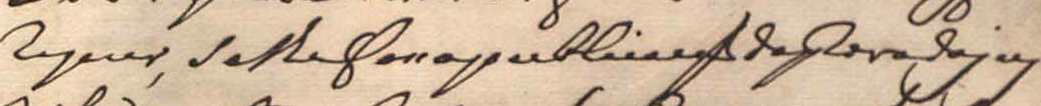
Requer, se lhe fassa publicaçaõ da pRova da jus
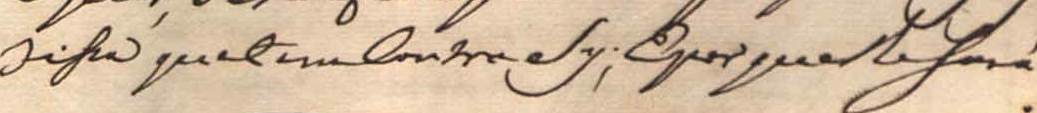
tissa que tem Contra sy; E porque lhe será
